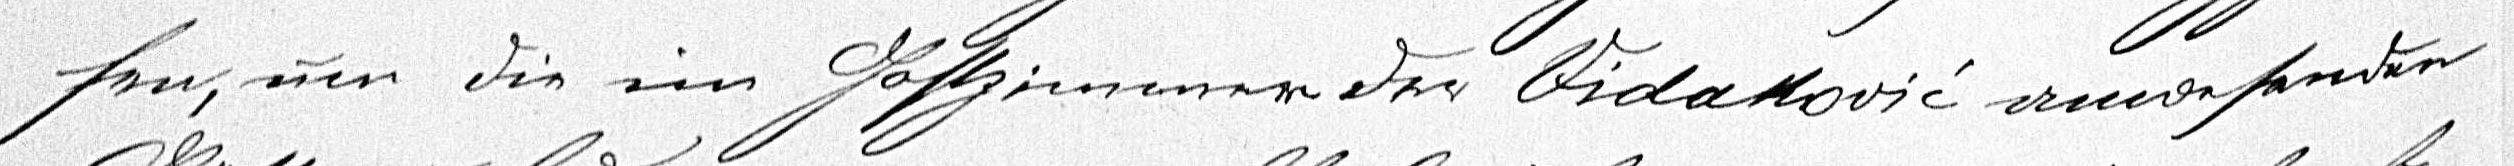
sen, um die im Gastzimmer der Vidaković anwesenden
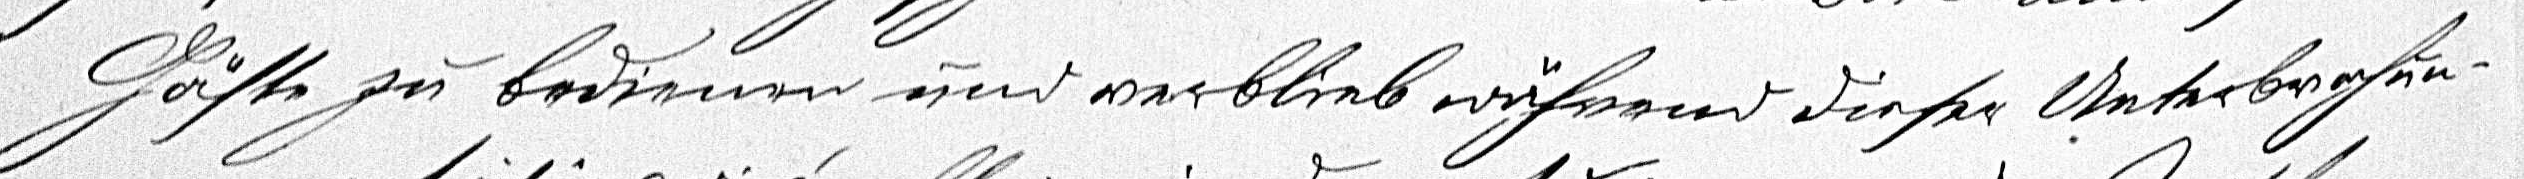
Gäste zu bedienen und verblieb während dieser Unterbrechun¬
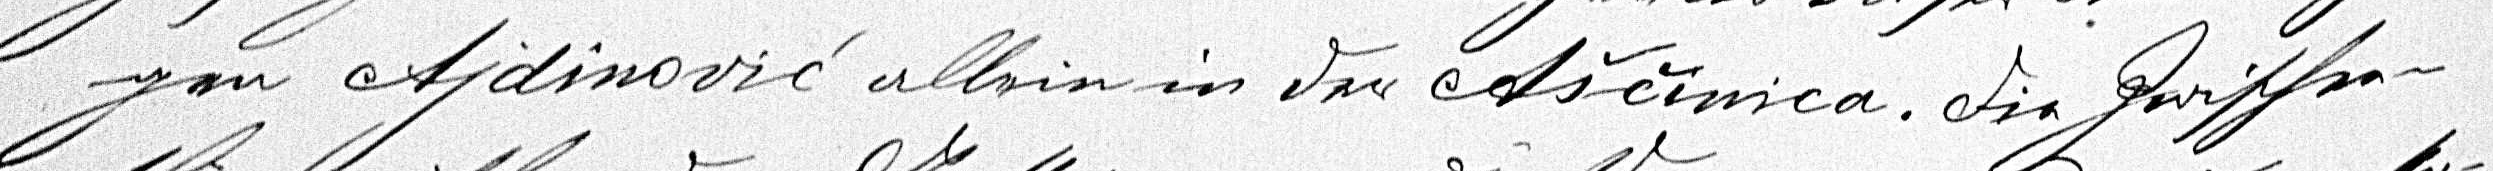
gen Ajdinović allein in der Aščinica. Die Zwischen¬
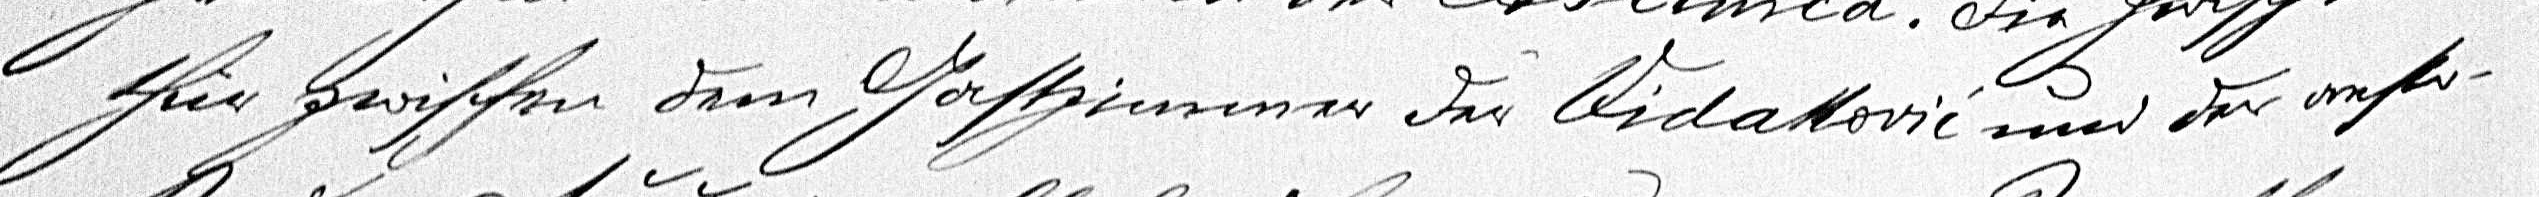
thür zwischen dem Gastzimmer der Vidaković und der ansto¬
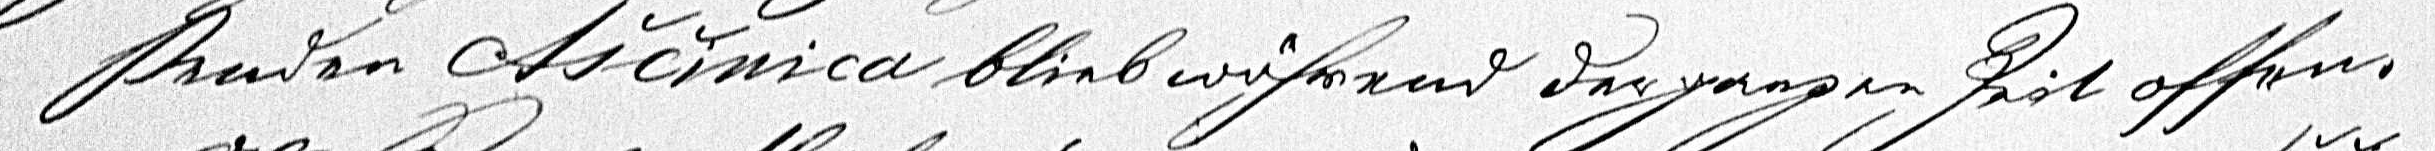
ßenden Aščinica blieb während der ganzen Zeit offen.
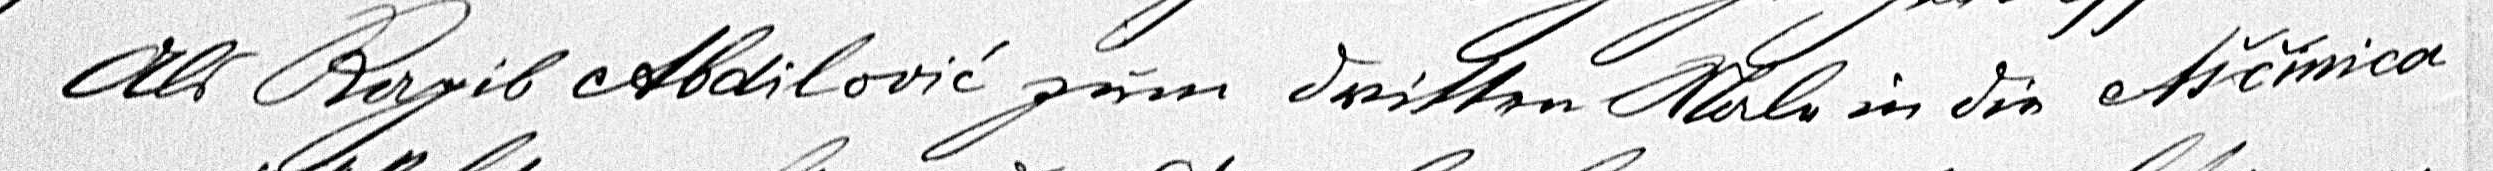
Als Ragib Abdilović zum dritten Male in die Aščinica
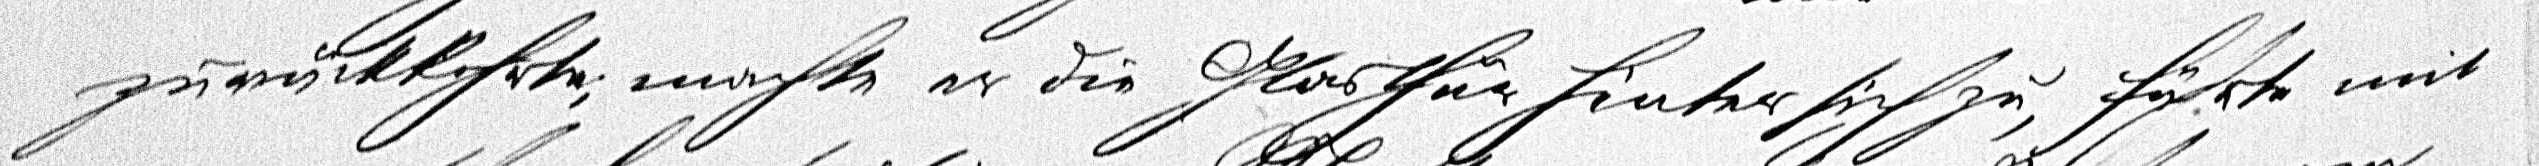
zurückkehrte, machte er die Glasthür hinter sich zu, führte mit
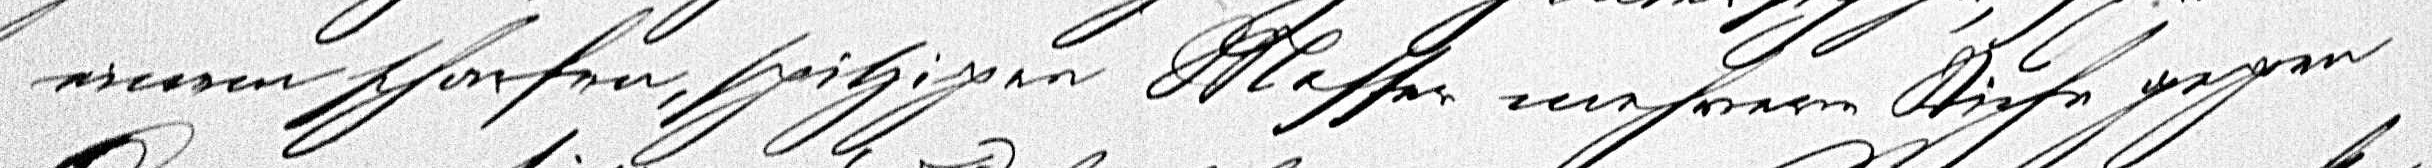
einem scharfen, spitzigen Messer mehrere Stiche gegen
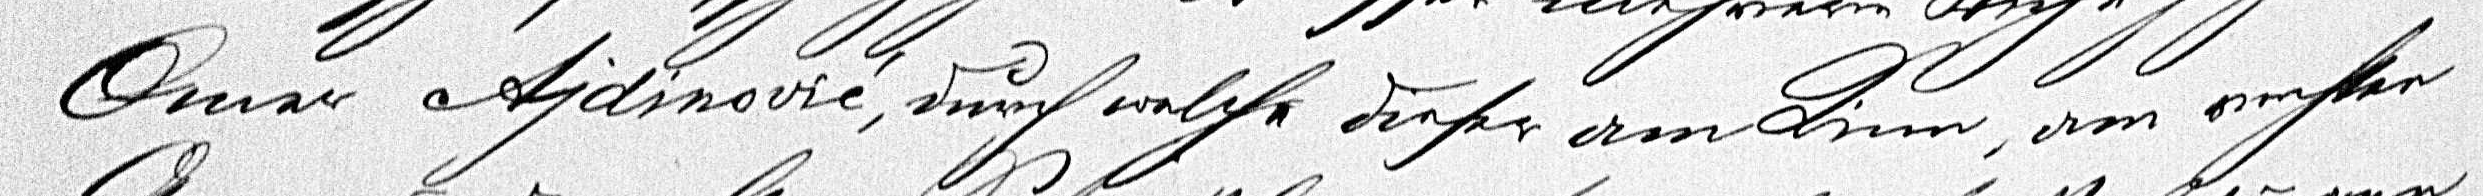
Omar Ajdinović, durch welche dieser am Kinn, am rechter
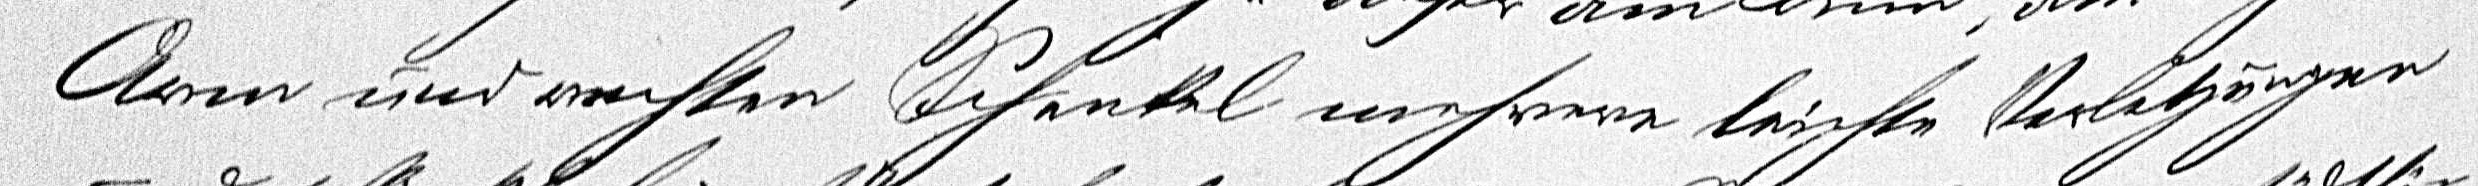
Arm und rechten Schenkel mehrere leichte Verletzungen
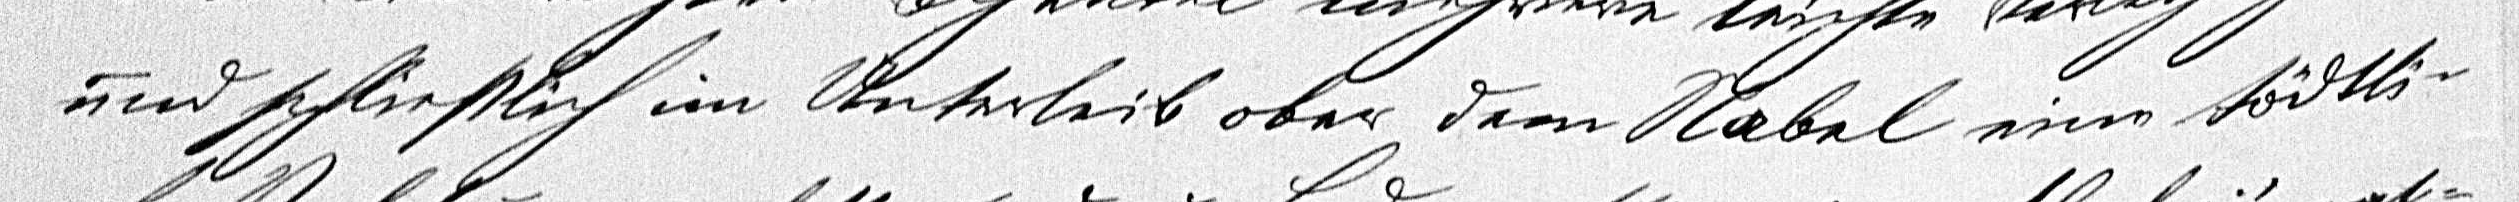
und schließlich im Unterleib ober dem Nabel eine tödtli¬
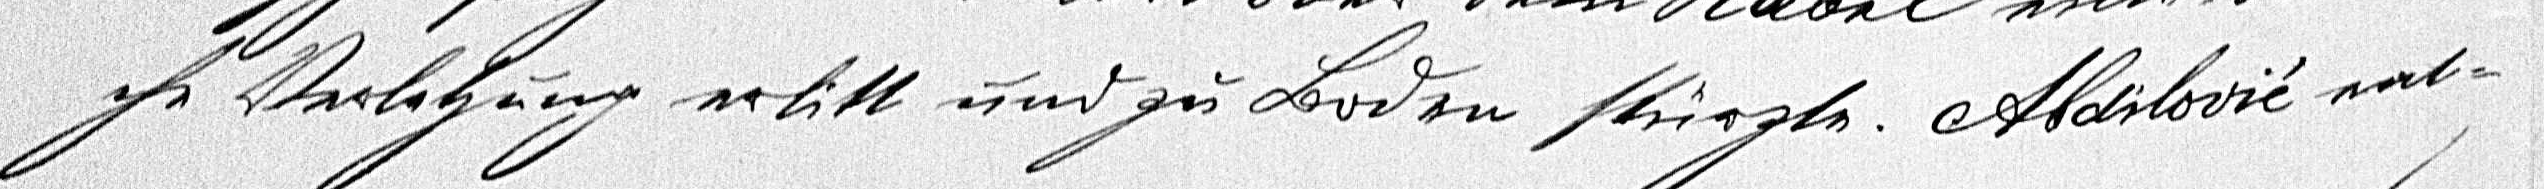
che Verletzung erlitt und zu Boden stürzte. Abdilović ent¬
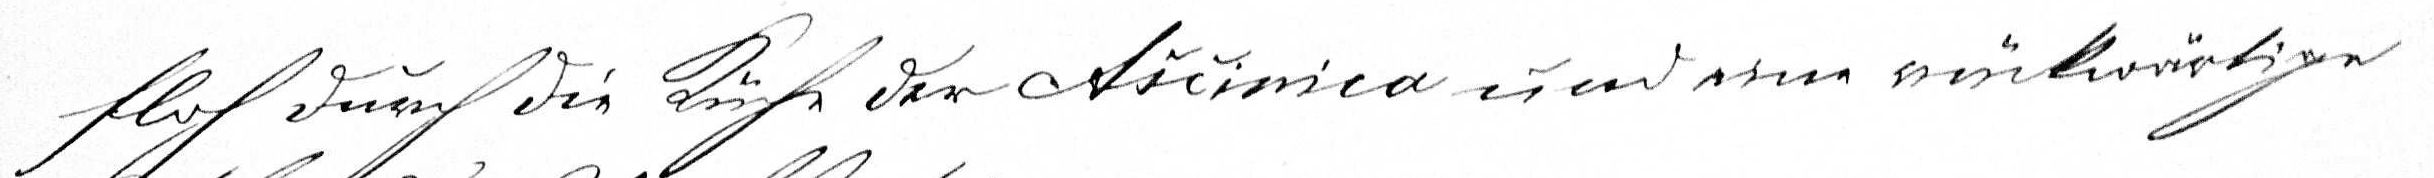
floh durch die Küche der Aščinica und eine ruuckwärtigen
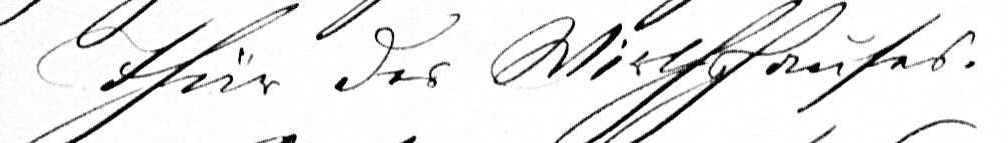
Thür des Wirthshauses.
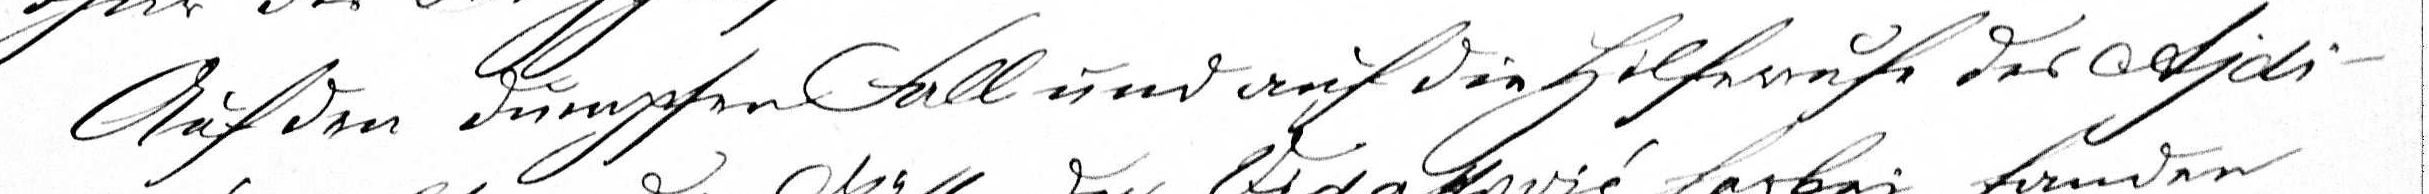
Auf den dumpfen Fall und auf die Hilferufe des Ajdi¬
